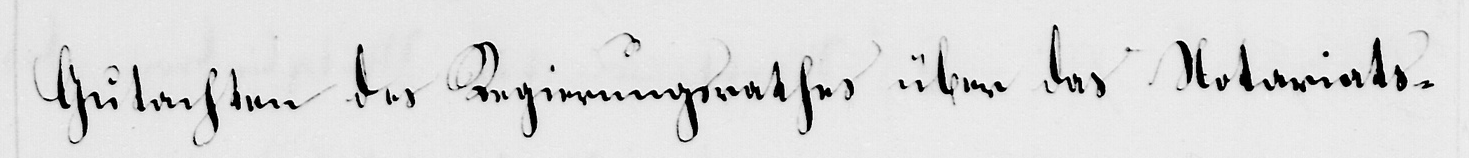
Gutachten des Regierungsrathes über das Notariats¬
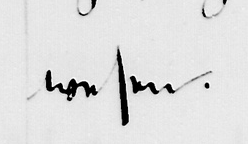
wesen.
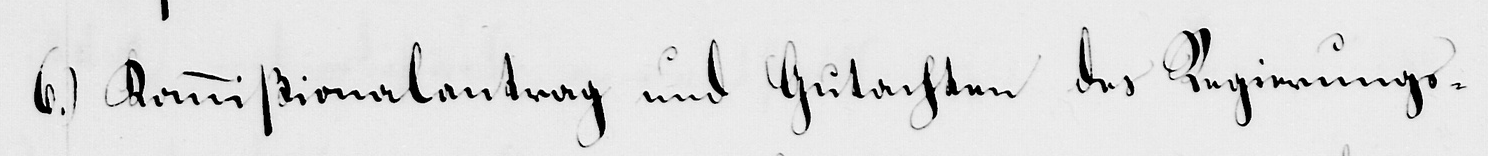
6.) Kommißionalantrag und Gutachten des Regierungs¬
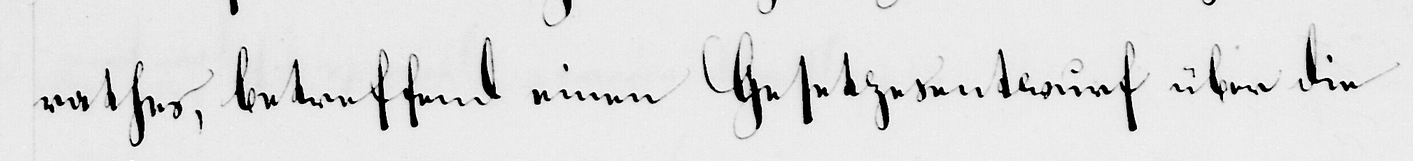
rathes, betreffend einen Gesetzesentwurf über die
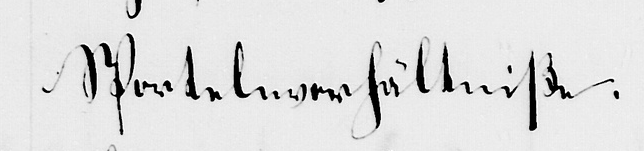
Sportelnverhältniße.
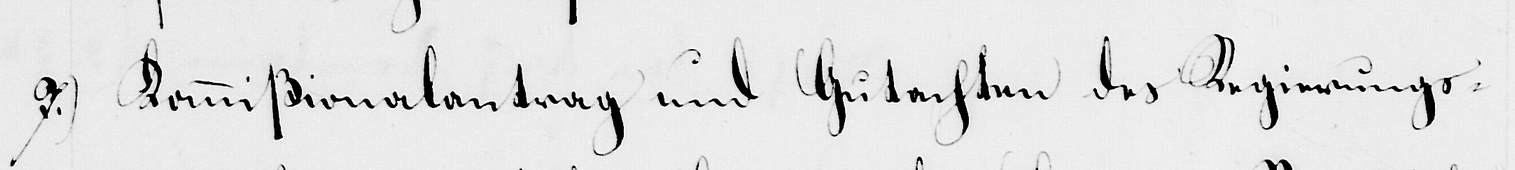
7.) Kommißionalantrag und Gutachten des Regierungs¬
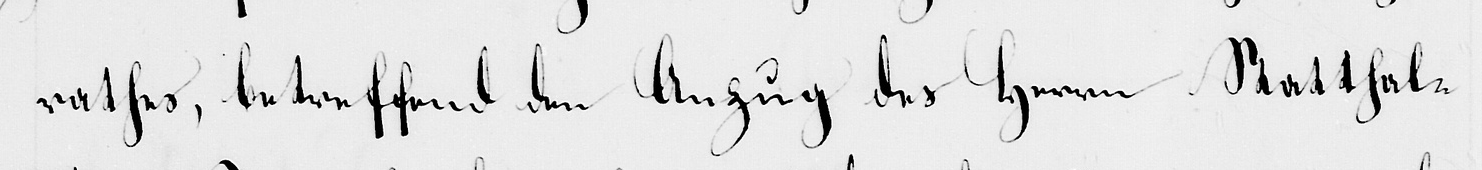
rathes, betreffend den Anzug des Herrn Statthal¬
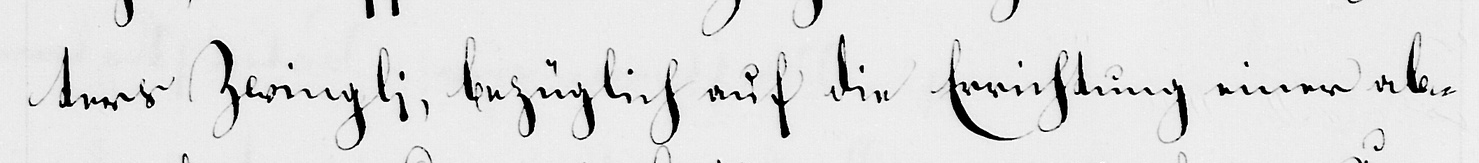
ters Zwingli, bezüglich auf die Errichtung einer ab¬
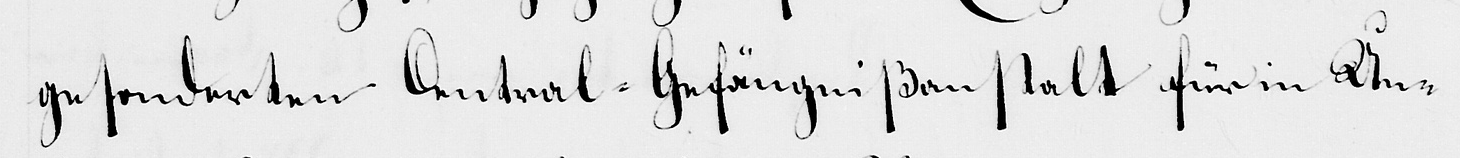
gesonderten Central-Gefängnißanstalt für in Un¬
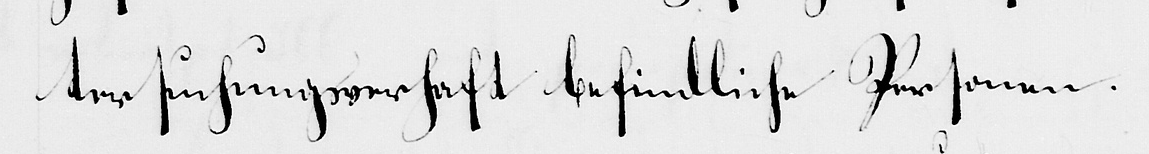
tersuchungsverhaft befindliche Personen.
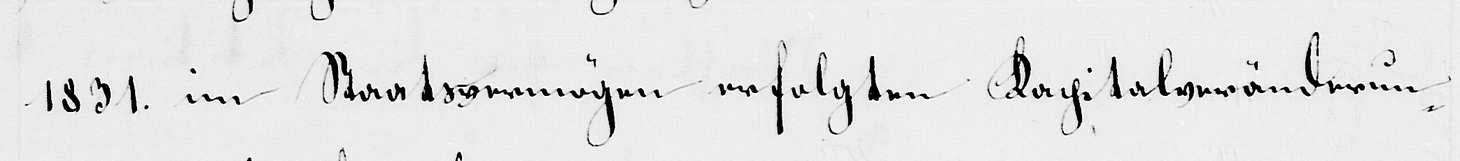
1831. im Staatsvermögen erfolgten Kapitalveränderun¬
